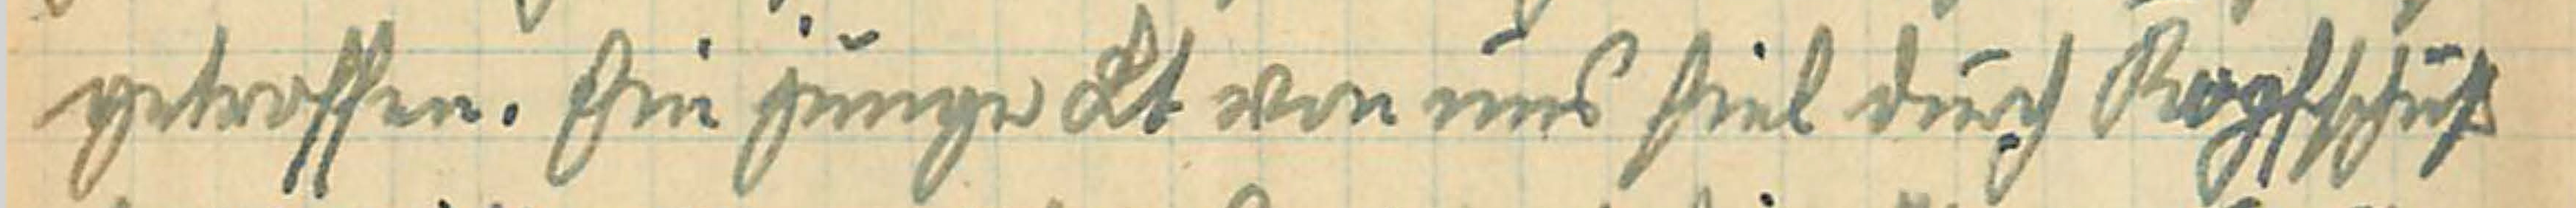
getroffen. Ein junger Lt von uns fiel durch Kopfschuß.
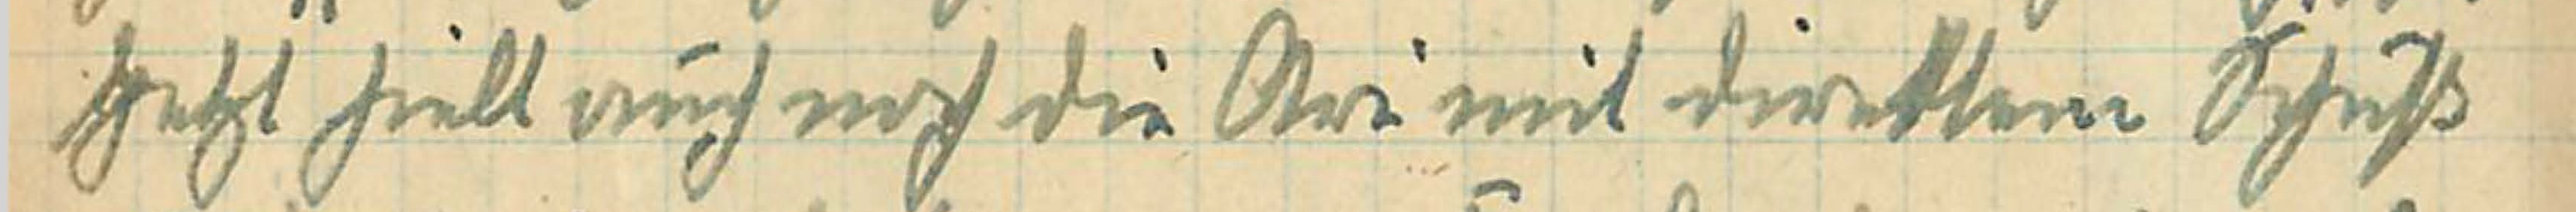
Jetzt hielt auch noch die Ari mit direktem Schuß
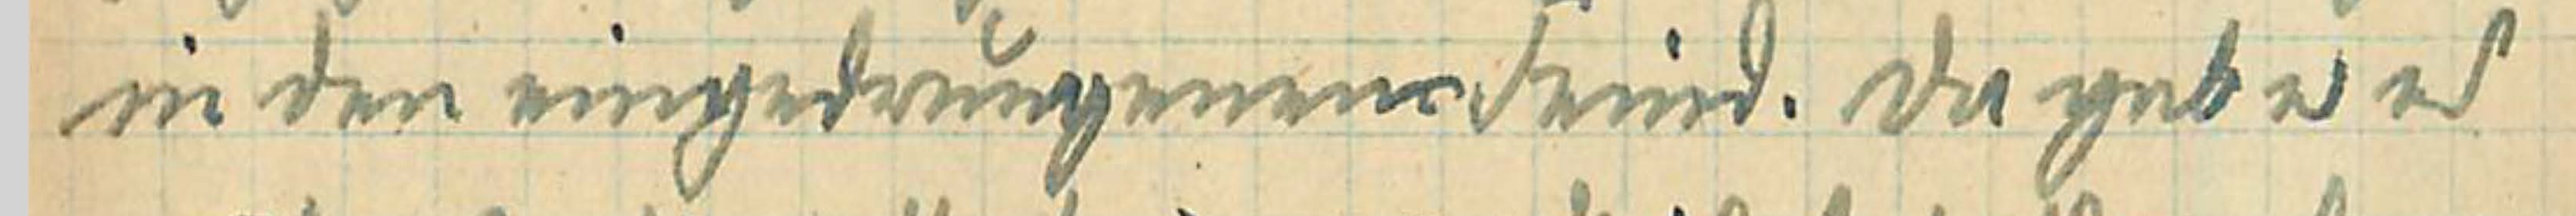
in den eingedrungenen Feind. Da gab er es
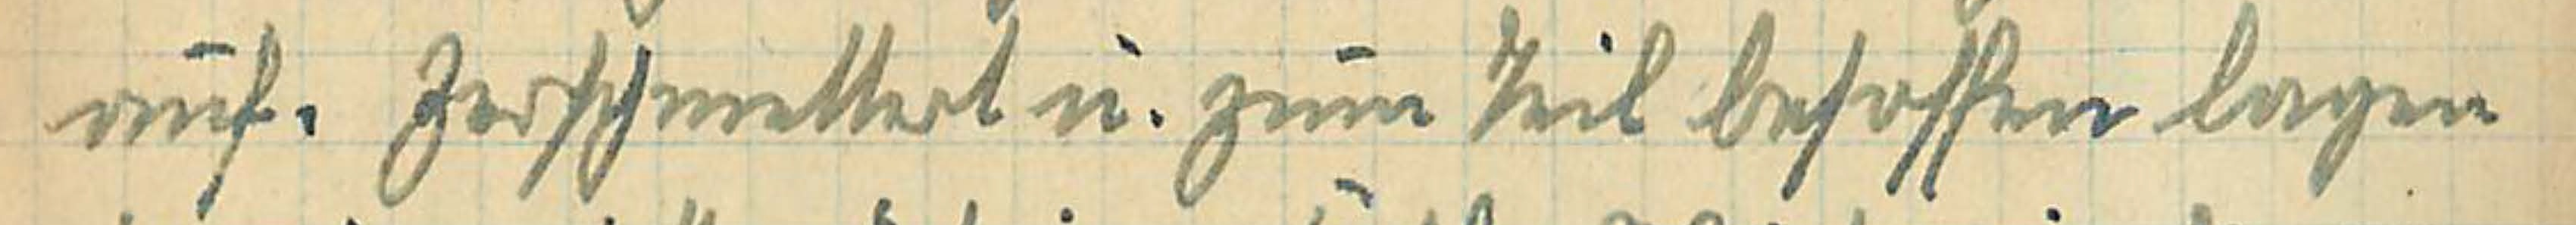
auf. Zerschmettert u. zum Teil besoffen lagen
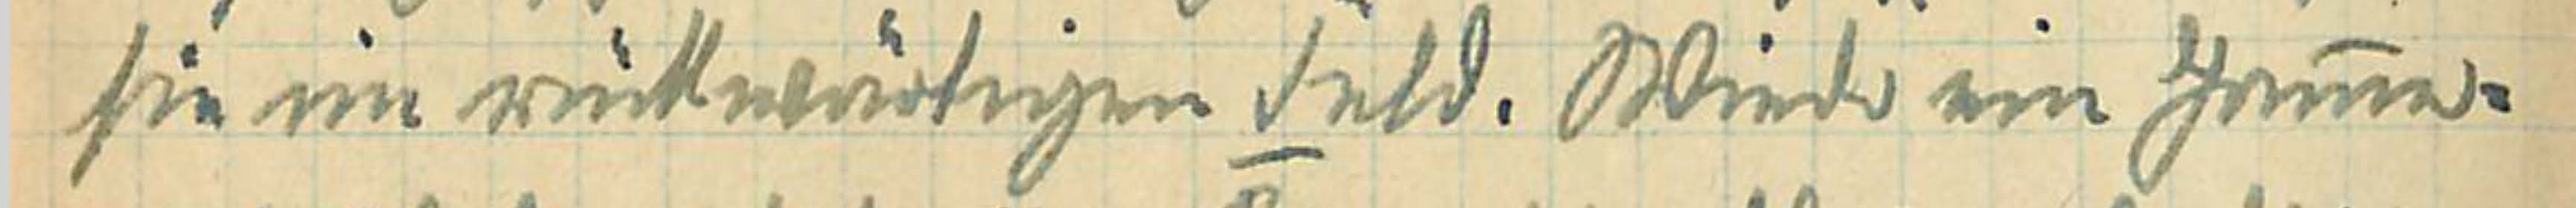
sie im rückwärtigen Feld. Wieder ein Jammer-
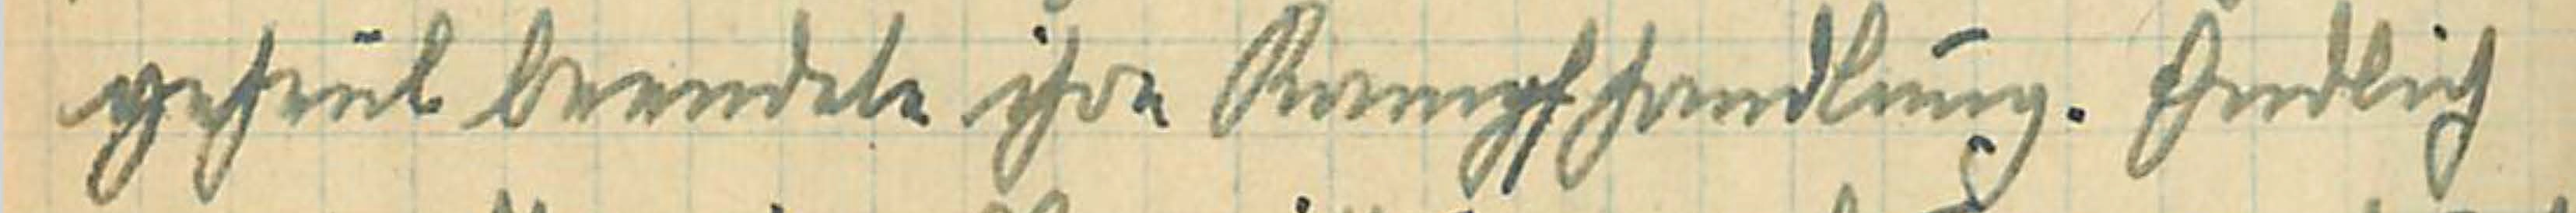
geheul beendete ihre Kampfhandlung. Endlich
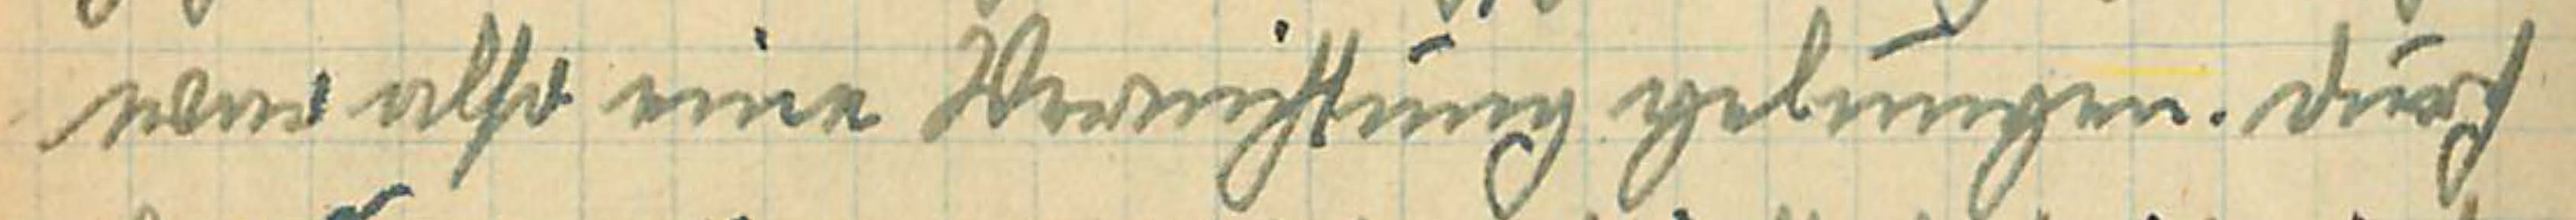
war also eine Vernichtung gelungen. Durch
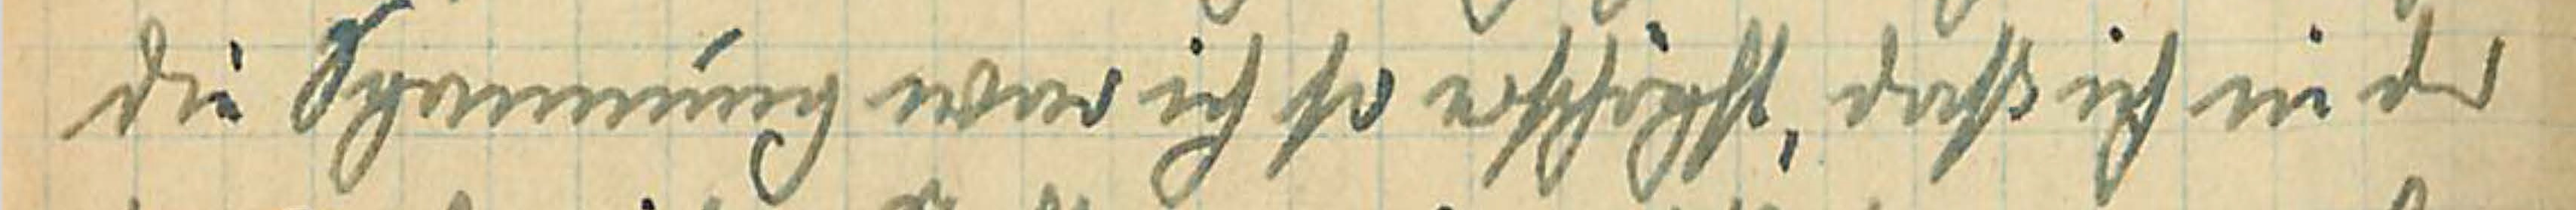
die Spannung war ich so erschöpft, daß ich in der
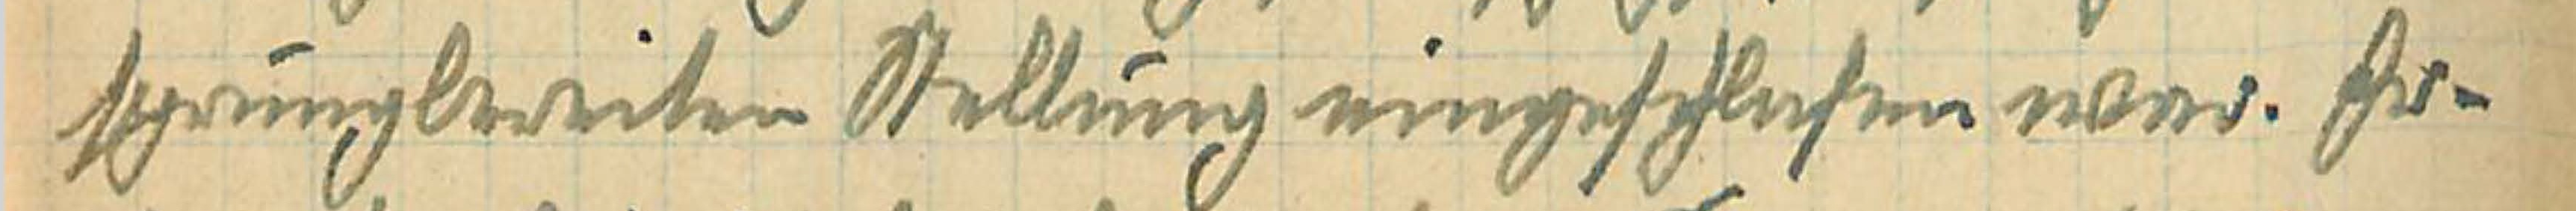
sprungbereiten Stellung eingeschlafen war. Er-
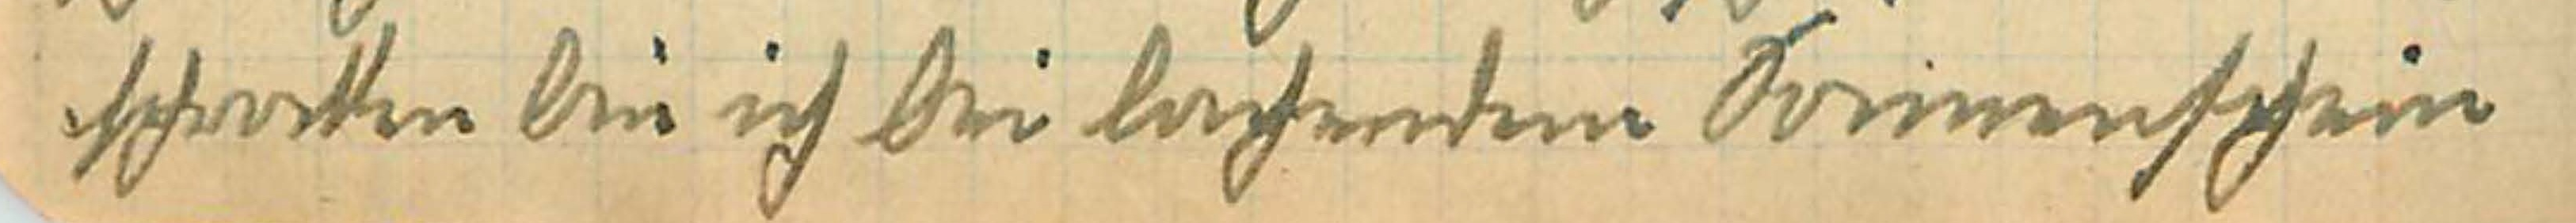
schrocken bin ich bei lachendem Sonnenschein
